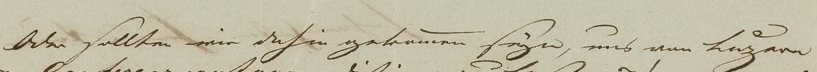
Oder sollten wir dahin gekommen seyn, uns von Luzern
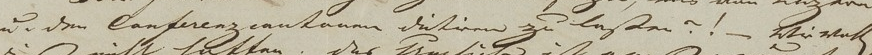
u. den Conferenzcantonen dictiren zu laßen?! – Wir wollen
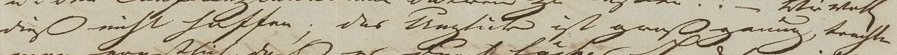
dieß nicht hoffen; das Unglük ist groß genug, trachte
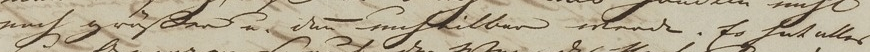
noch größer u. dann unheilbar werde. Es hat alles
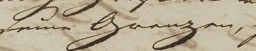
seine Grenzen,
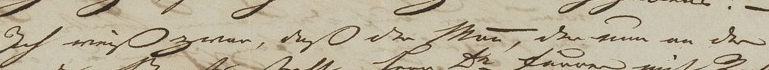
Ich weiß zwar, daß der Mann, der nun an der
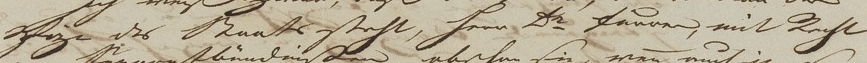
Spize des Staats steht, Herr DrFurrer, mit Recht
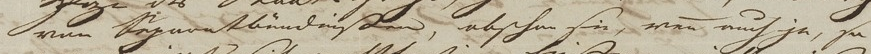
von Separatbündnißen, obschon sie, wenn auch je, so
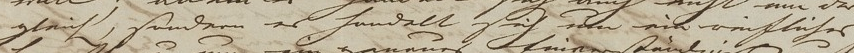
gleichen, sondern es handelt sich um ein reifliches
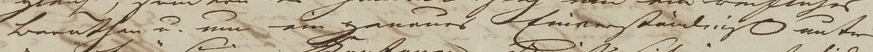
Berathen u. um ein genaues Einverständniß unter
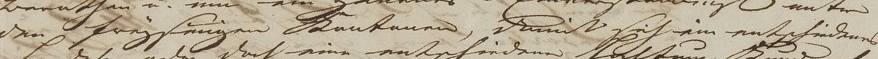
den freysinnigen Kantonen, damit sich ein entschiedenes
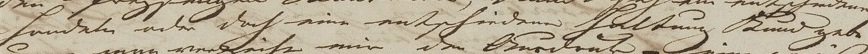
Handeln oder doch eine entschiedene Haltung Kund gebe
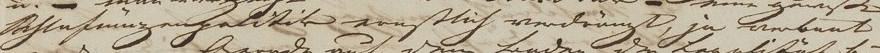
Schlafmüzenpolitik ernstlich verdrängt, ja verbannt
